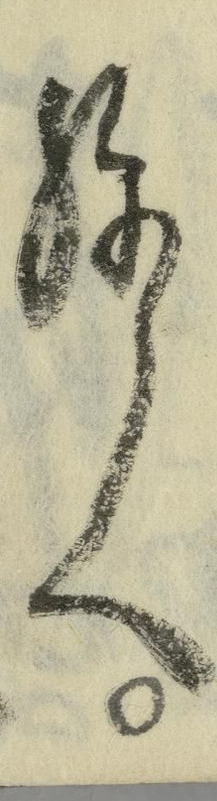孫兵衛
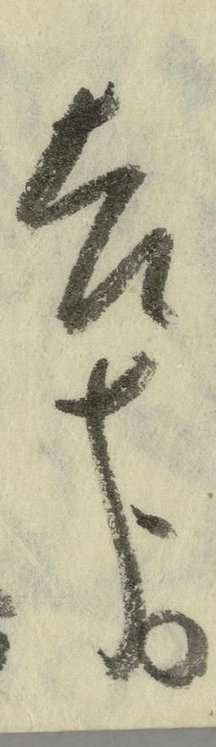嘉右衛門
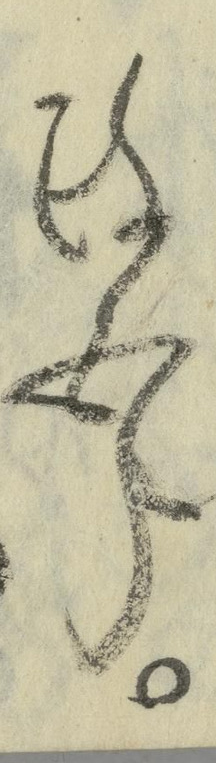庄五郎

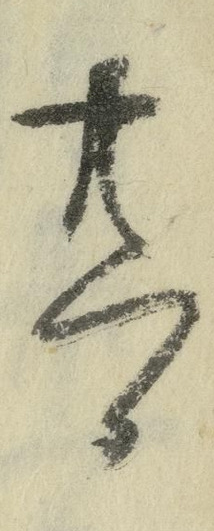廿一日
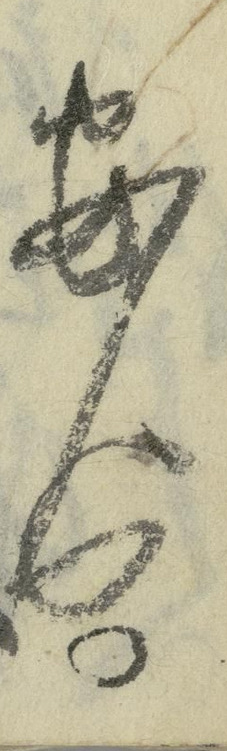安右衛門
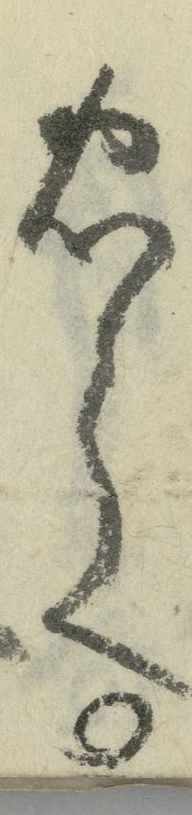安右衛門
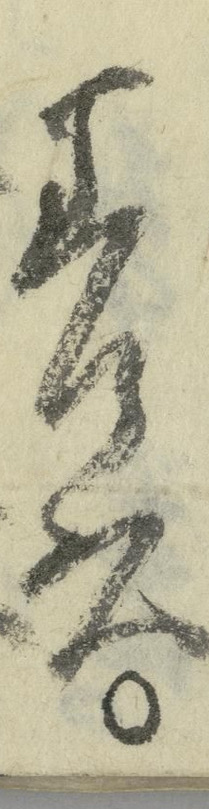利兵衛
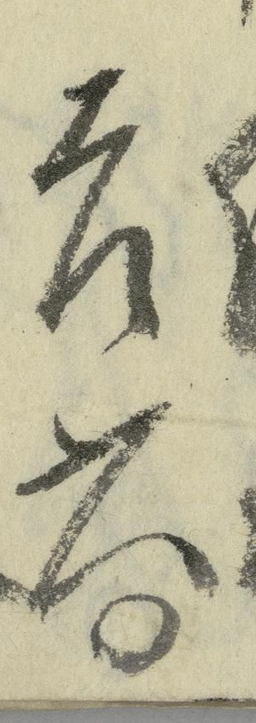吉右衛門
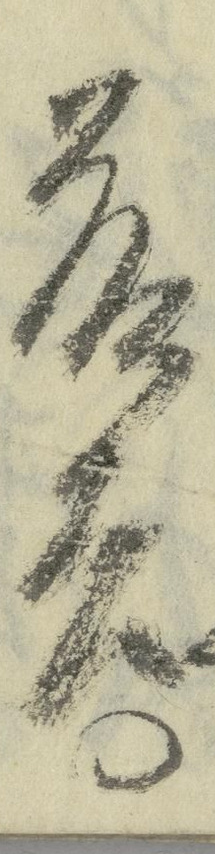安右衛門
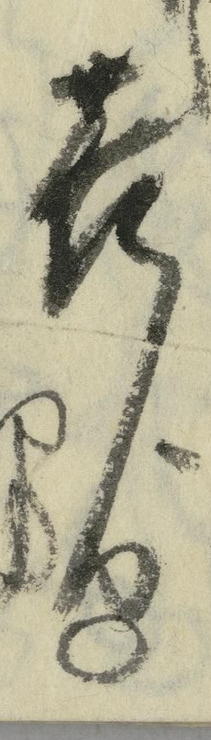吉右衛門
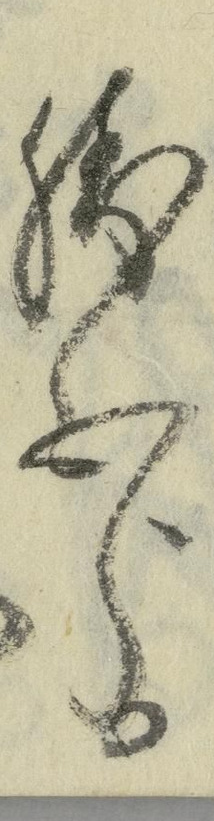勝五郎
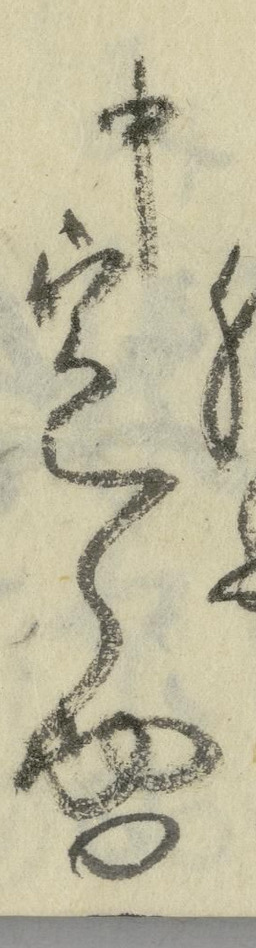宇之助
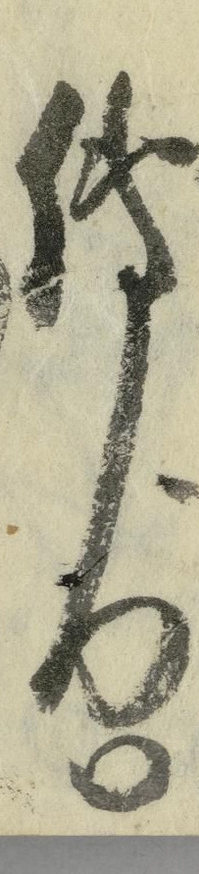伝右衛門
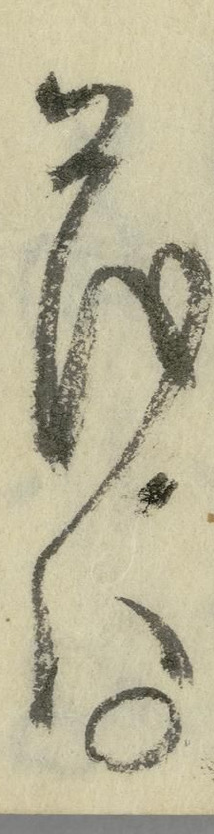安右衛門
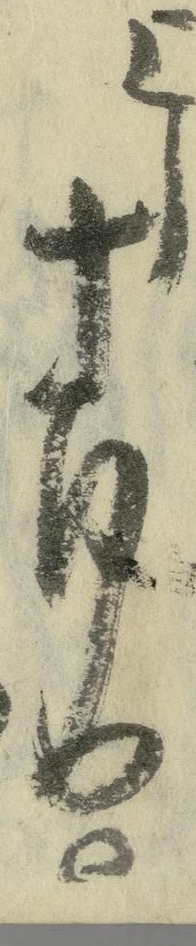廿一日
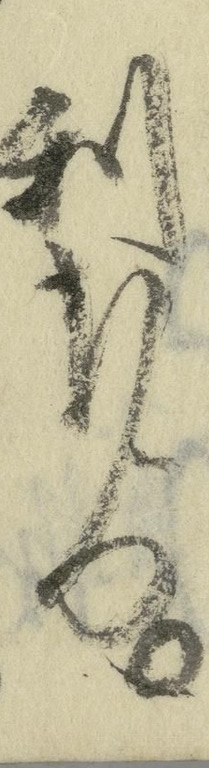十左衛門
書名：天明淺間噴火ニ関スル書類
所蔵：東京大学地震研究所図書室 Earthquake Research Institute Library, The University of Tokyo, JAPAN
